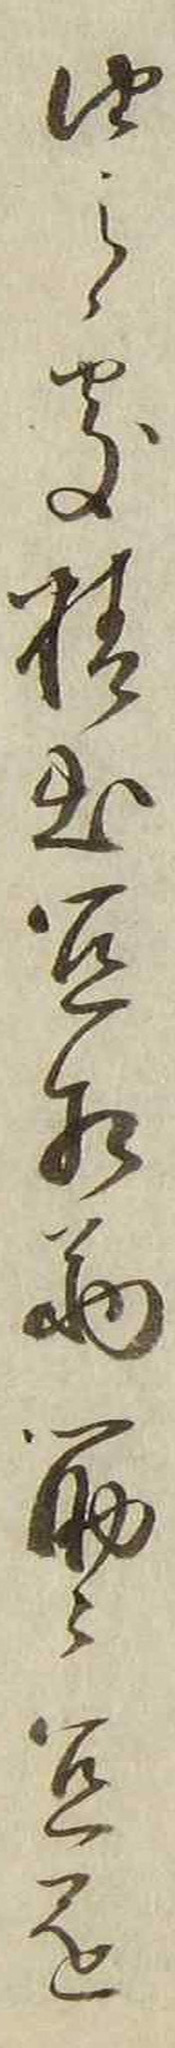由之処精出宜相勤筋々宜懸

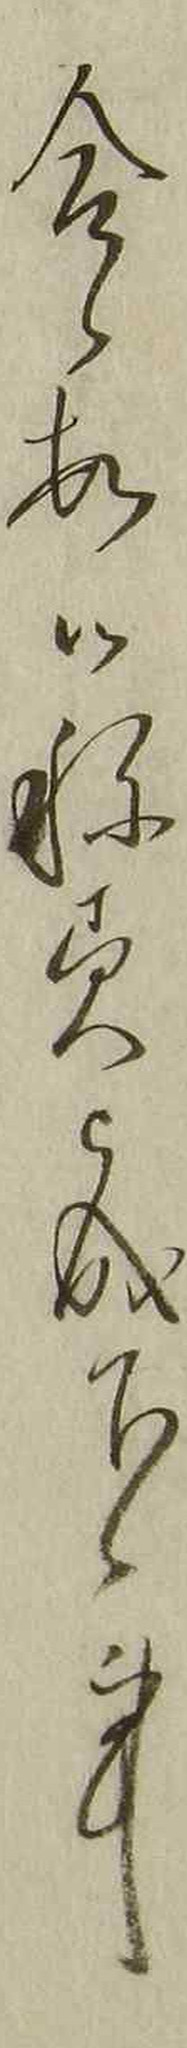合候段御称美被成下候事
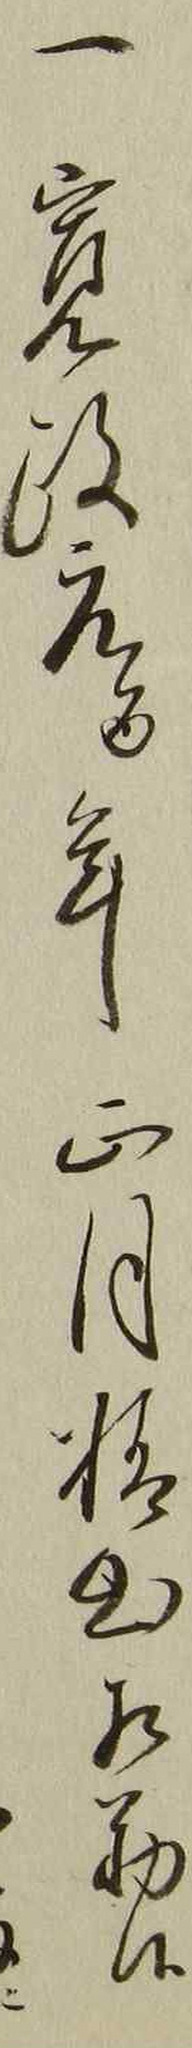一寛改元酉年正月精出相勤候
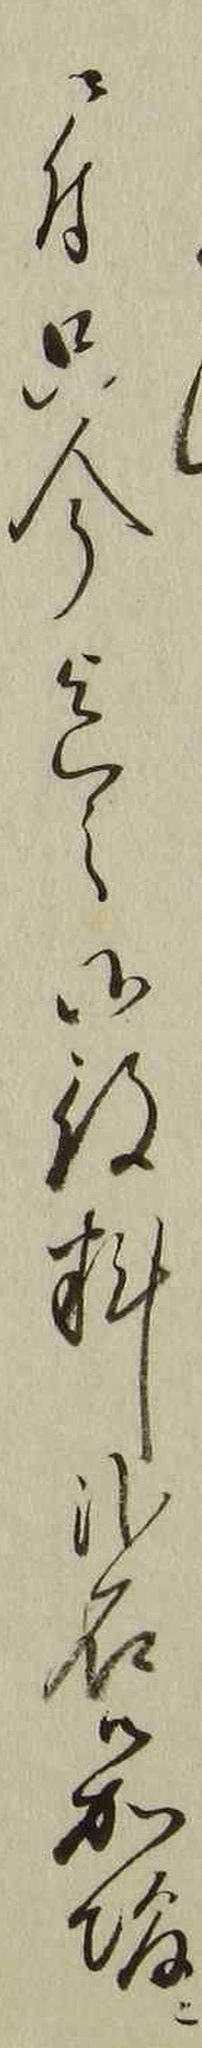ニ付只今迄之御役料弐石御加増ニ
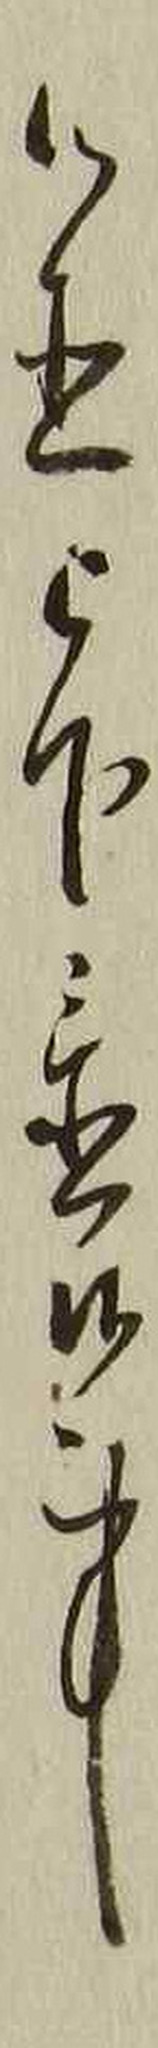御直被下置候事
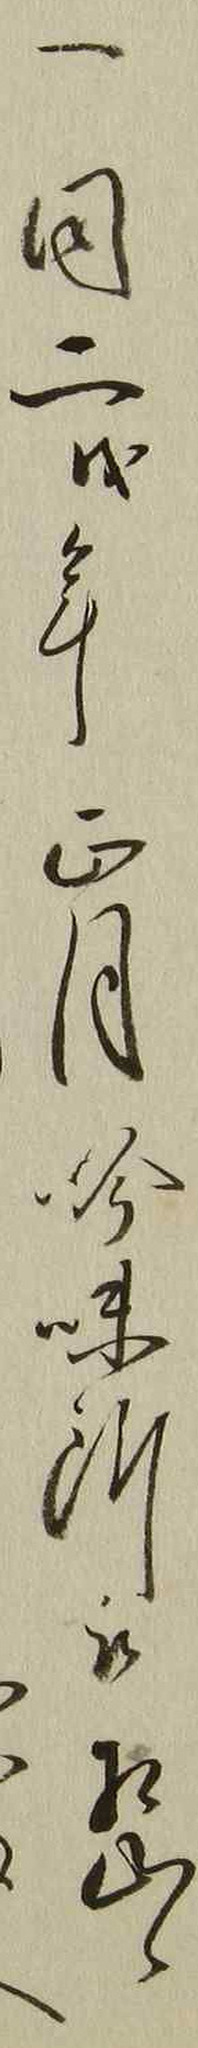一同二戌年正月吟味所被相止候
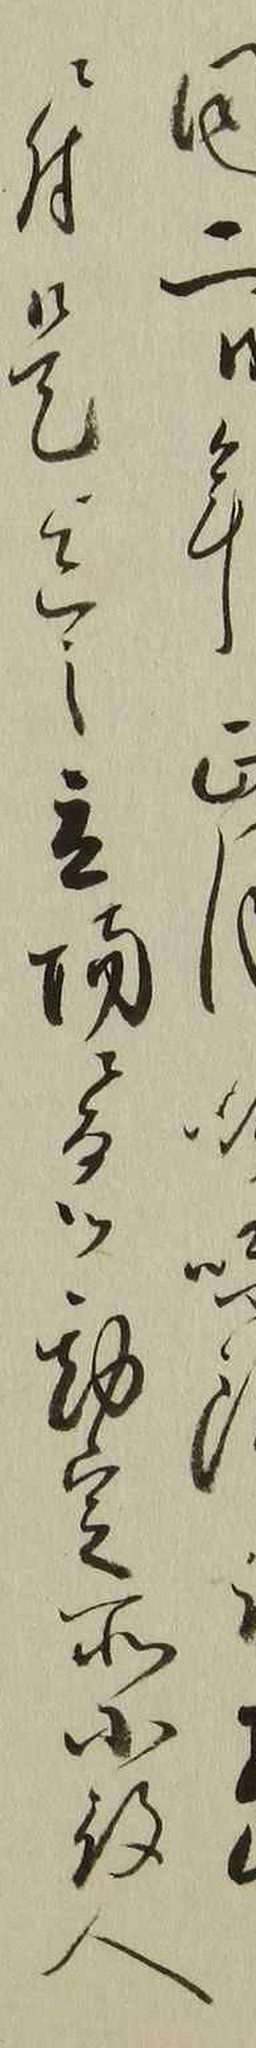ニ付是迄之立場ニ而御勘定所小役人
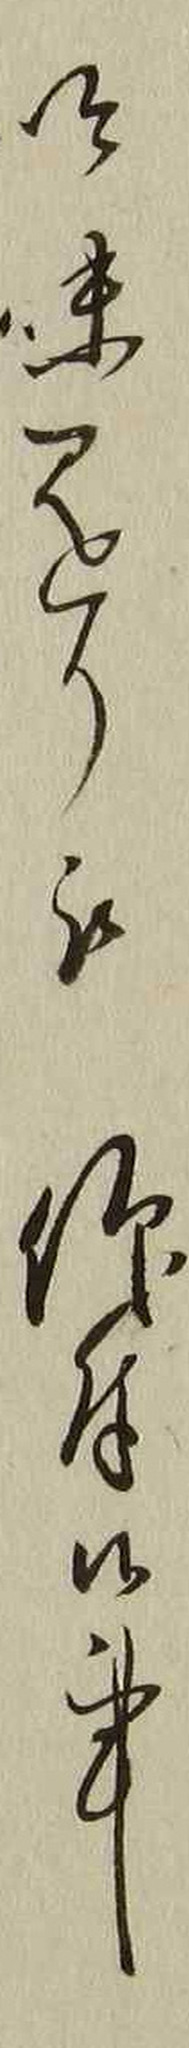吟味懸り被仰付候事
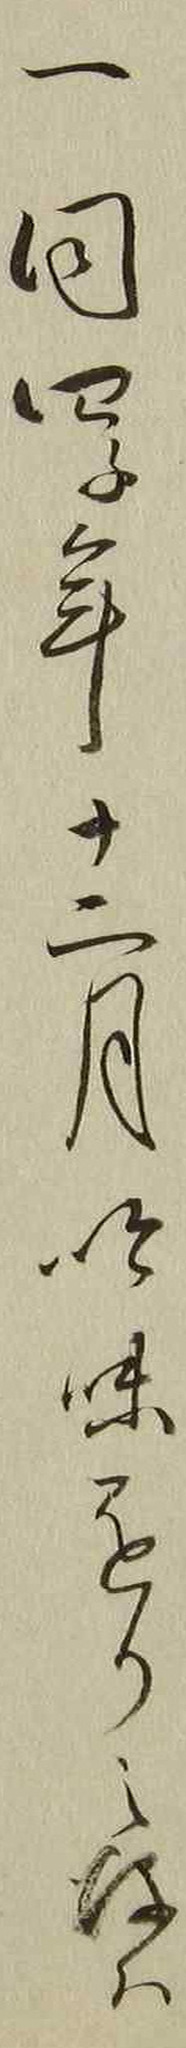一同四子年十二月吟味懸り之後ハ
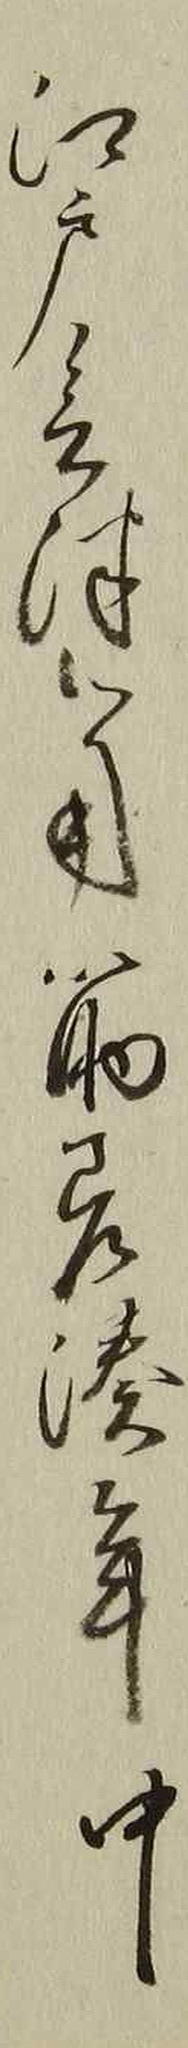江戸会津御用筋差湊年中
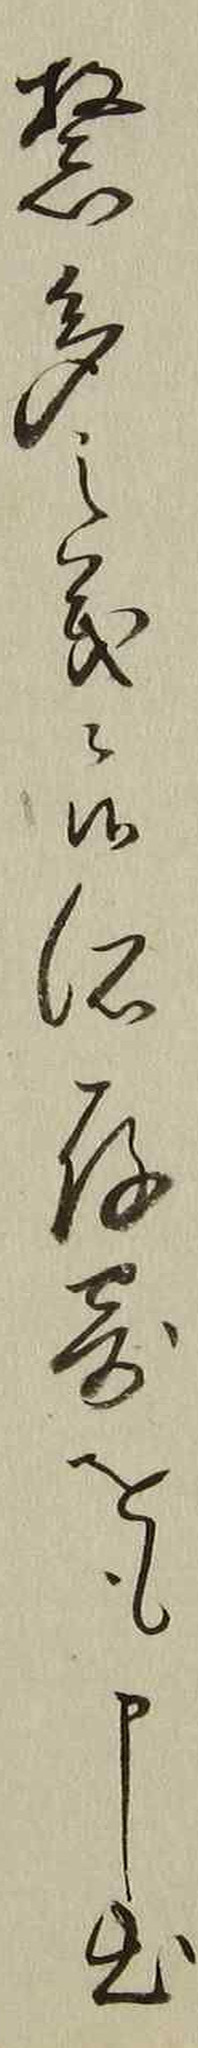繁多之義ニ候所存寄をも申出
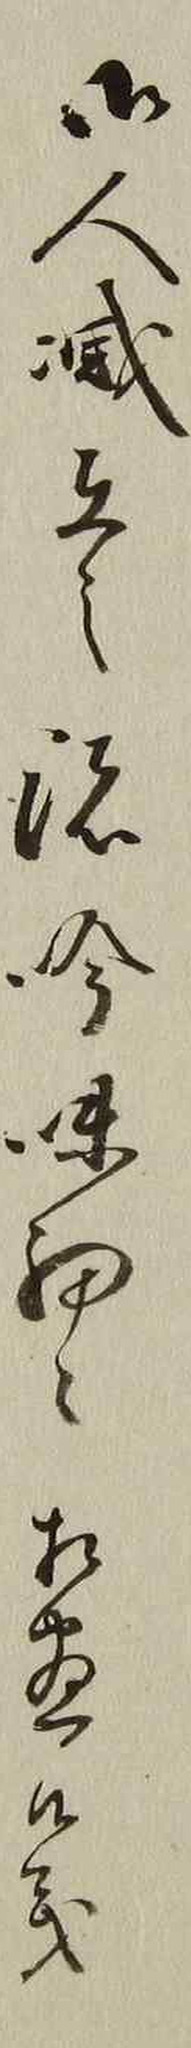御人減在之諸吟味細々相尽候義
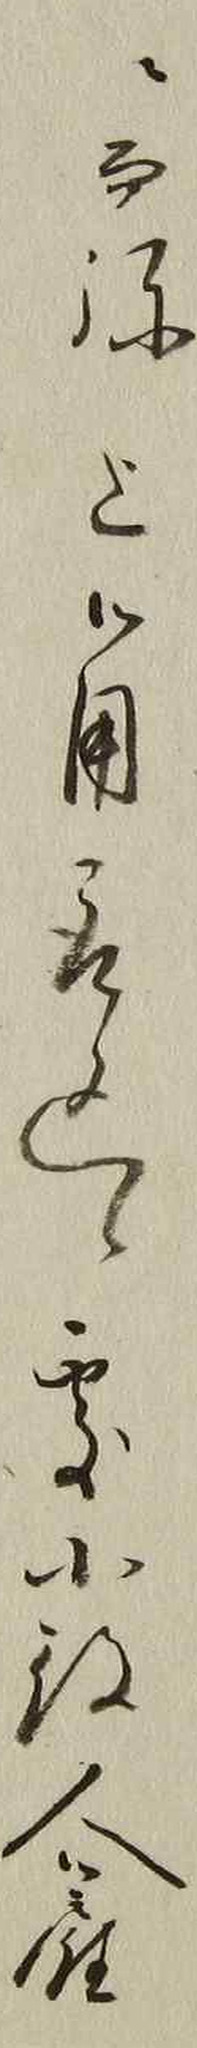ニ而弥上御用取込候処小役人雇
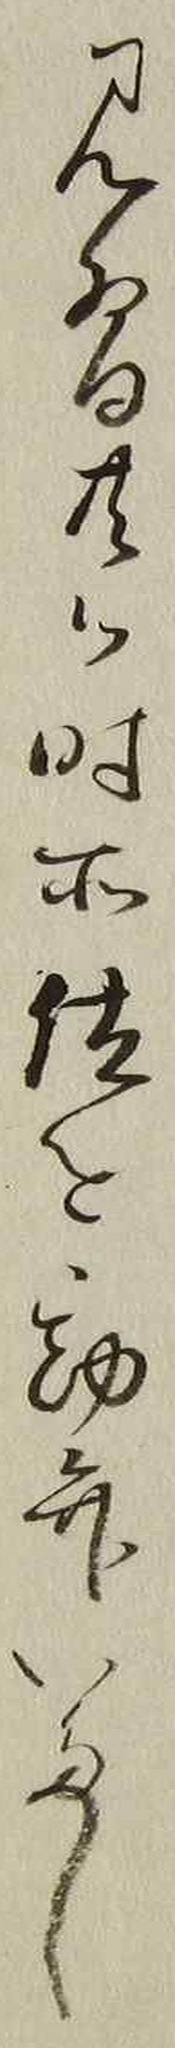見習共御時所位を勘弁いたし
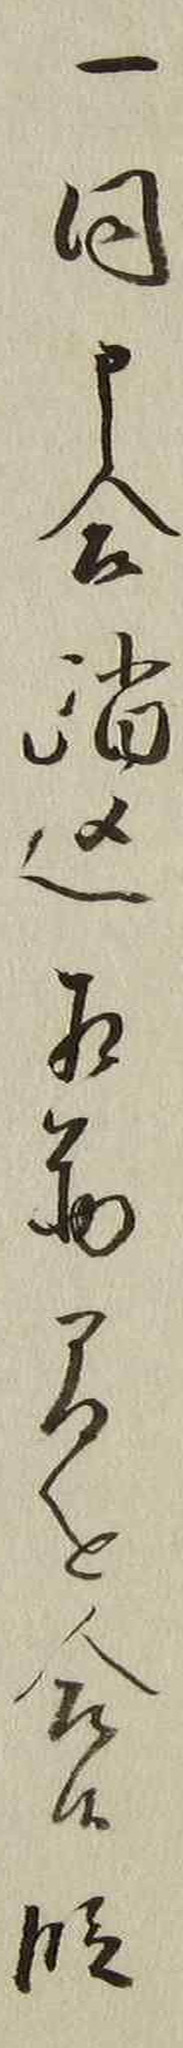一同申合踏込相勤間を合候段
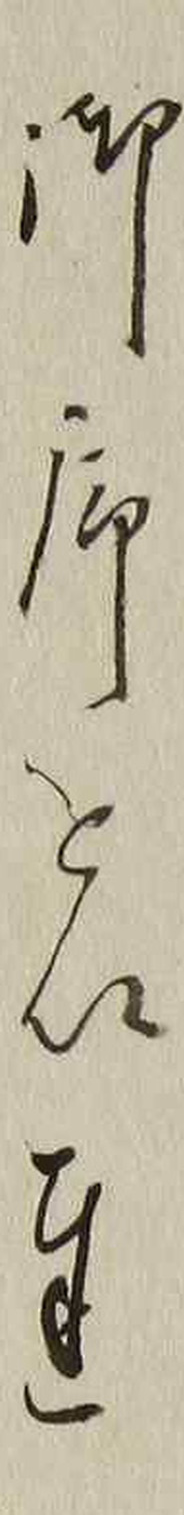御序を以達
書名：諸士系譜　巻之132　た之部8
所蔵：会津若松市立会津図書館
